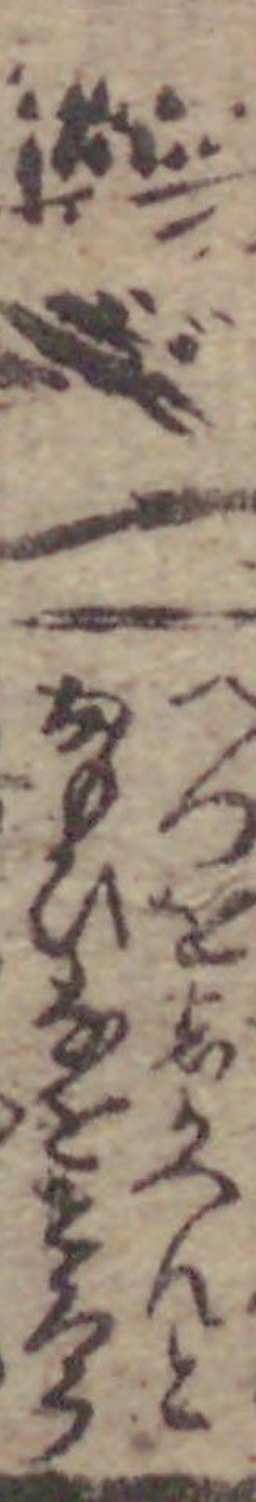おもひなをとろう
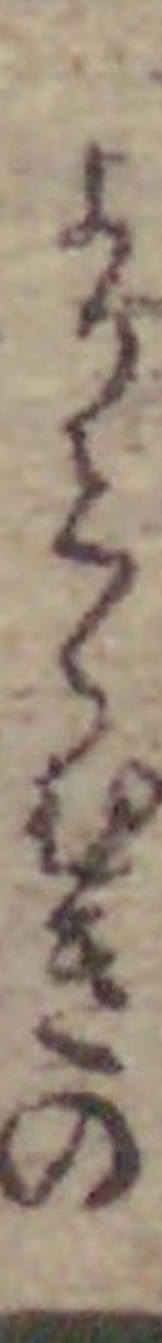よりとらむきの
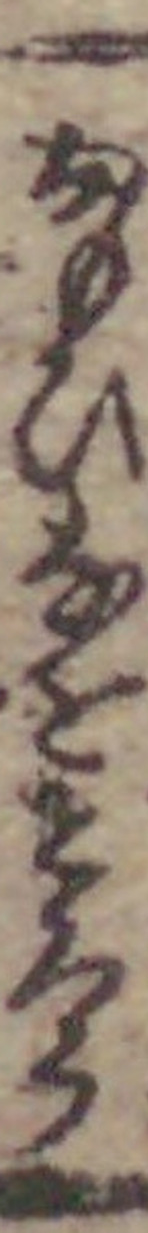おもひなをとろう
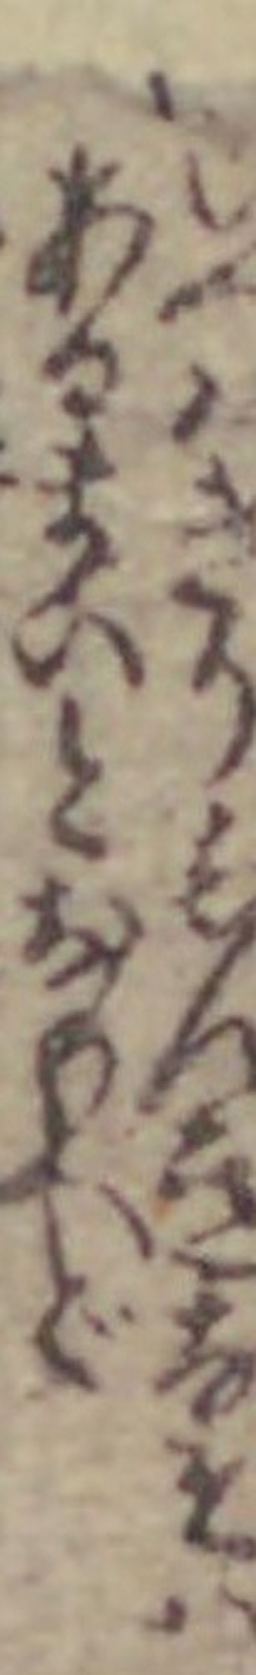あるまいとおもへど
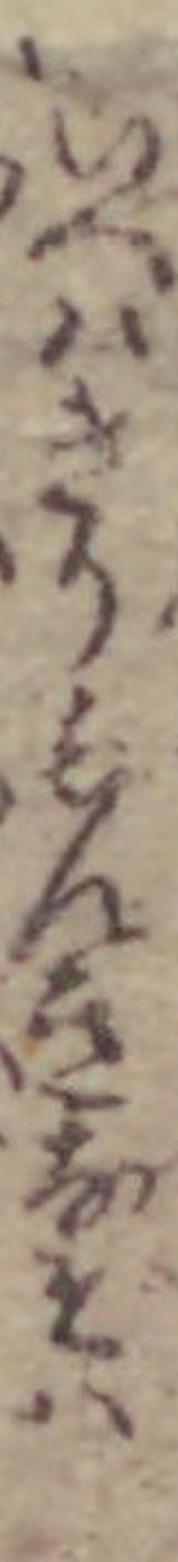いへはきりもんきなぞは
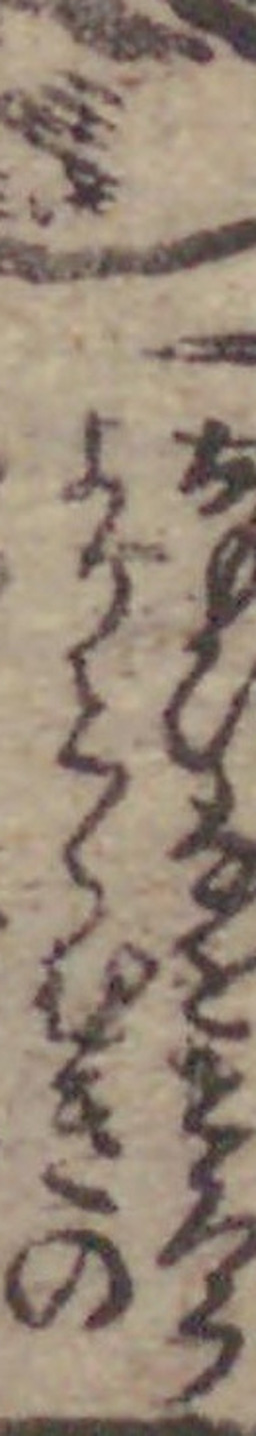よりとらむきの
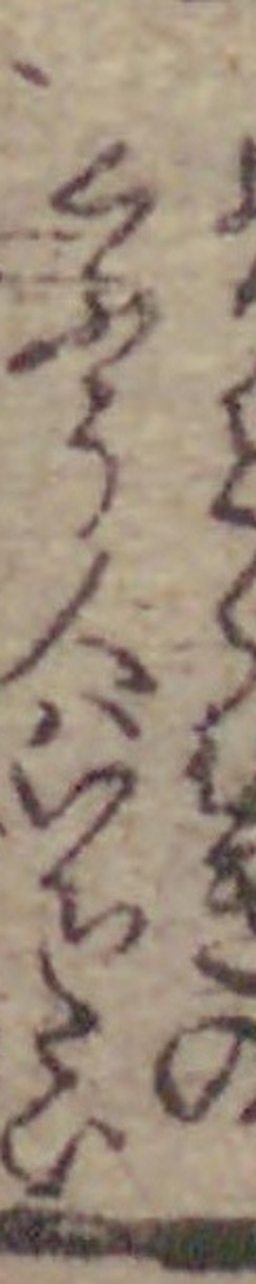くふう人はいちたい
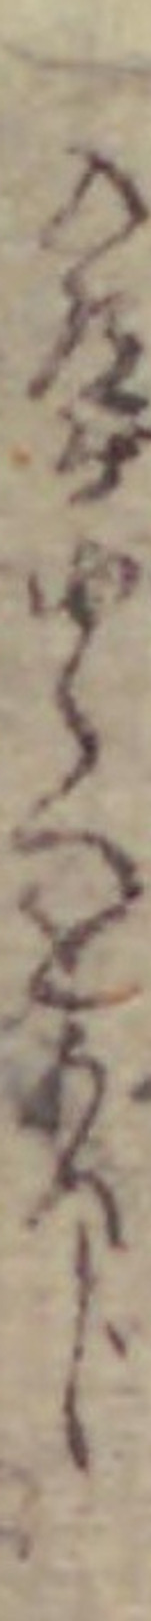入道がゆくへをあんじ
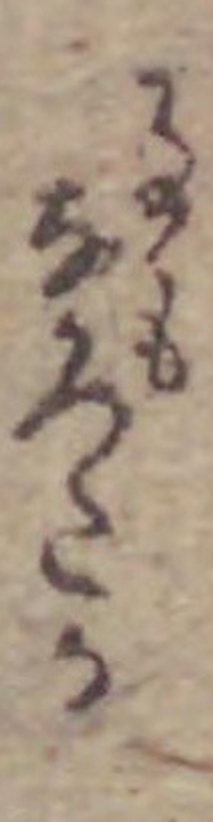なかつたか
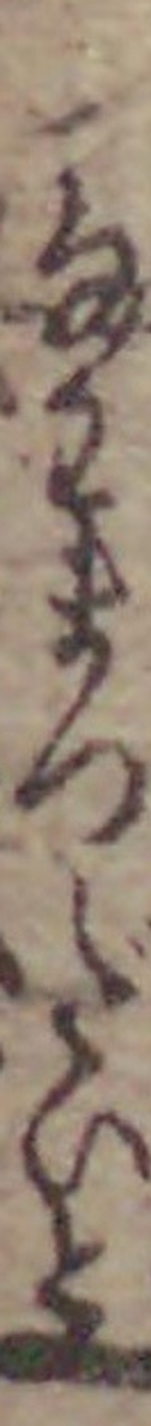なわまつだいと
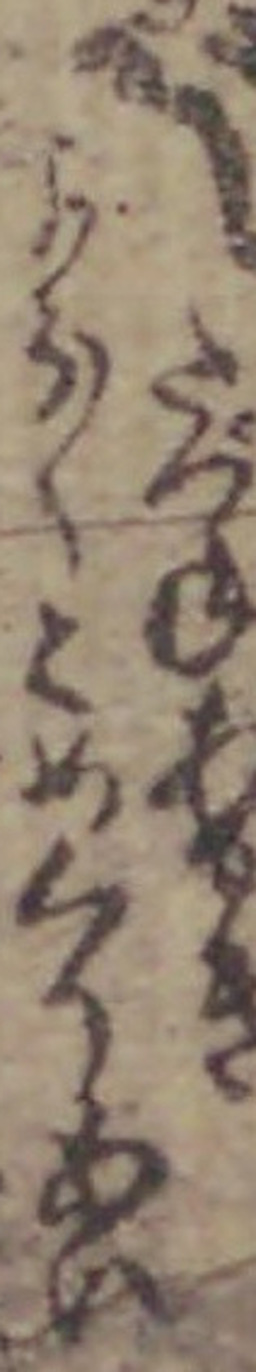よう〳〵とめくりあい
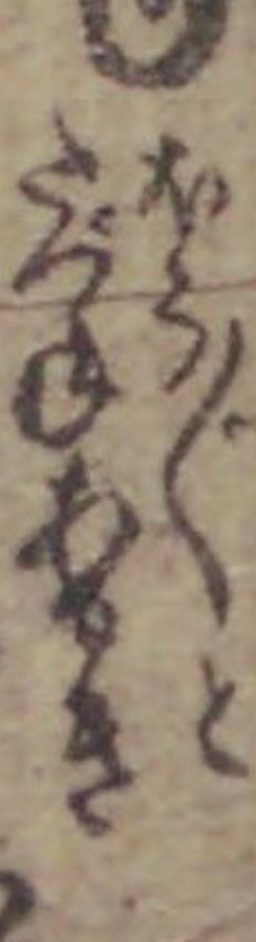たづねあるき
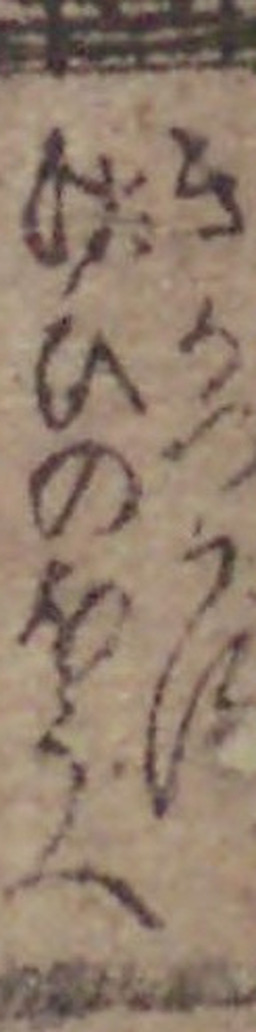げひのほうへ
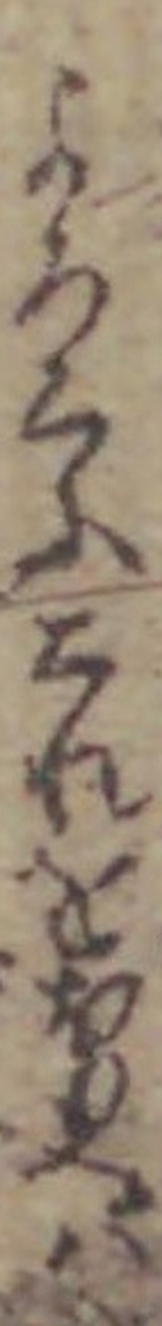よろこふこれをおもへは
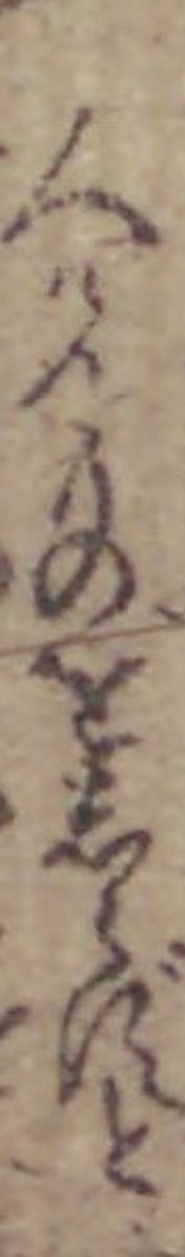人けんものをしらずと
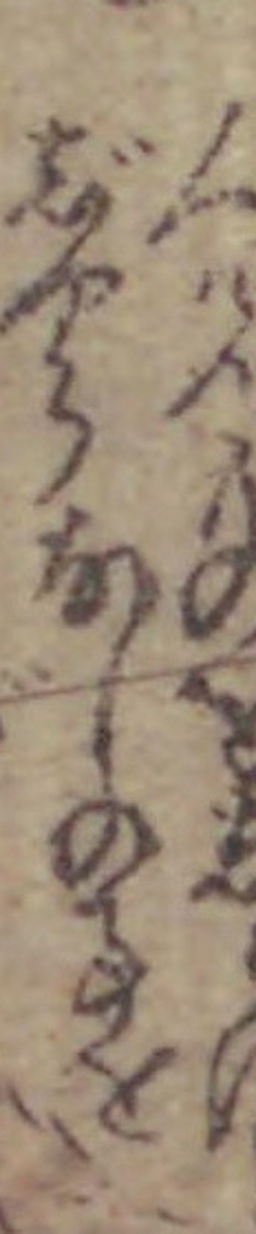じやうなしの事を
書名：化物鼻がひしげ 2巻
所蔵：国立国会図書館 National Diet Library, JAPAN
